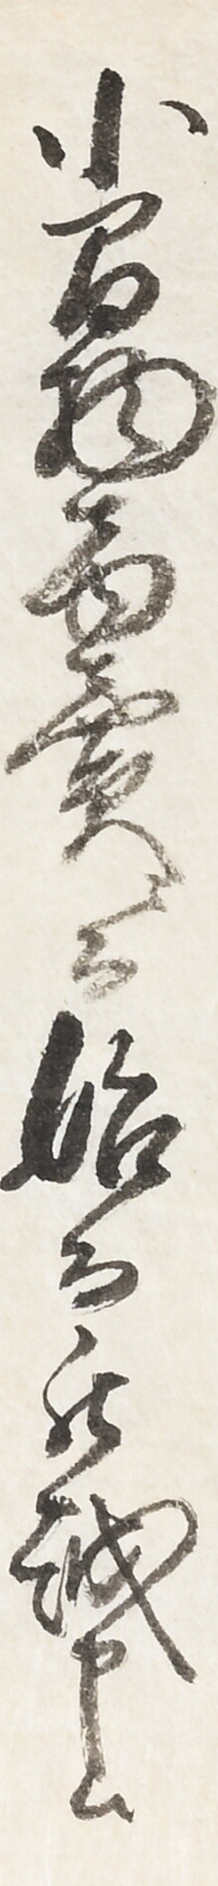小間物商売ニ而始而罷越申候
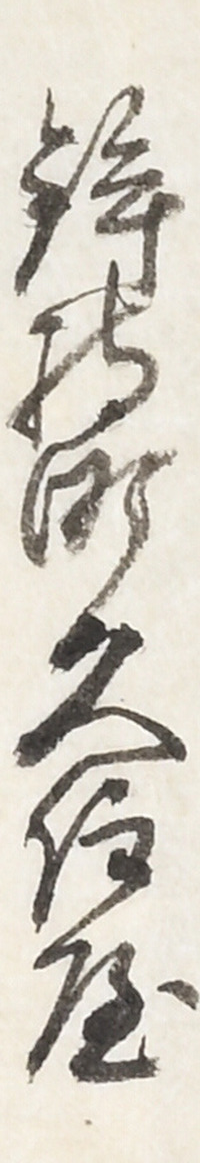鉾持村久住屋
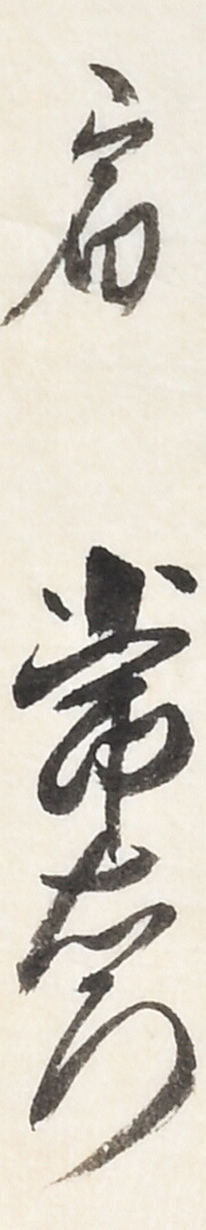宿常右衛門
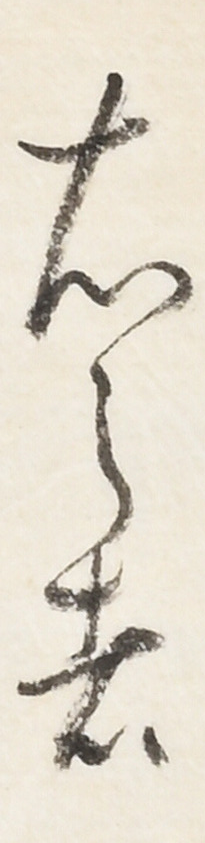右之者
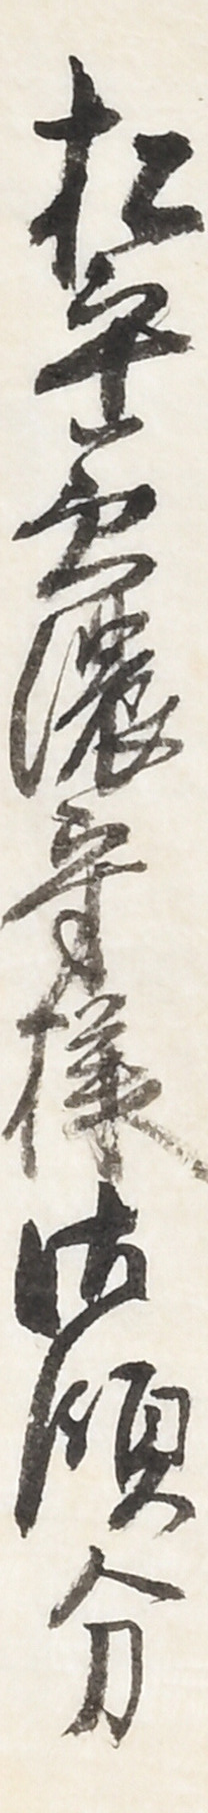松平美濃守様御領分
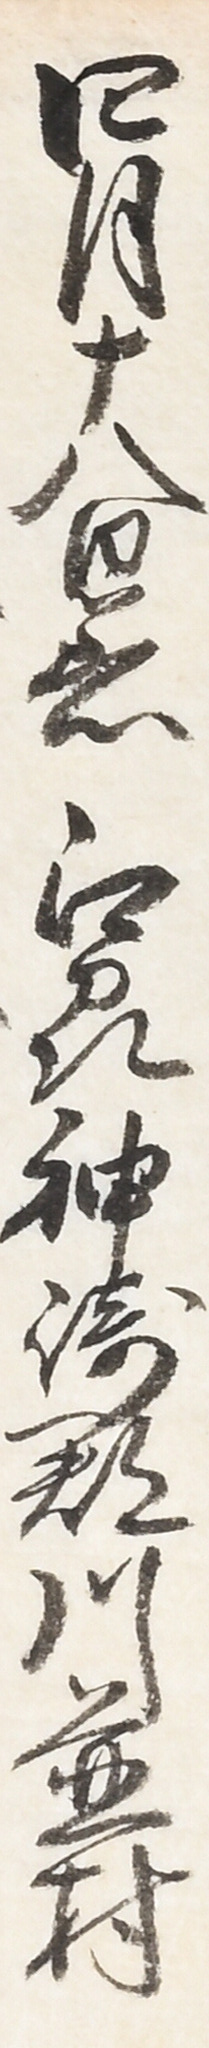四月十八日着江州神崎郡川並村
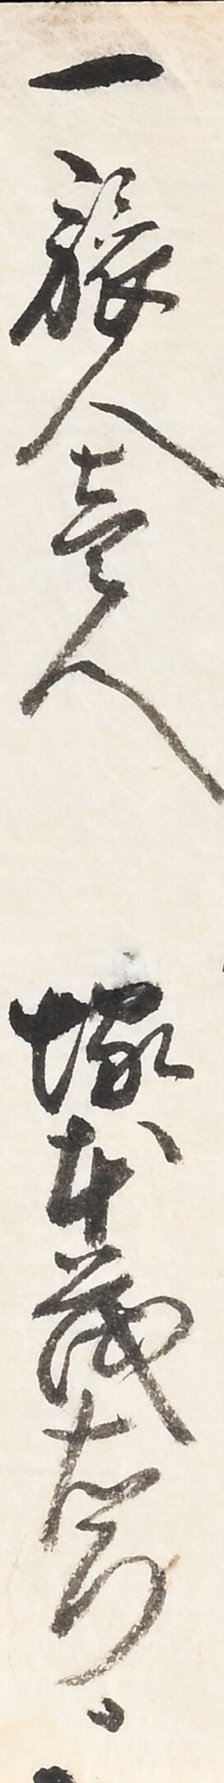一旅人壱人塚本茂右衛門・
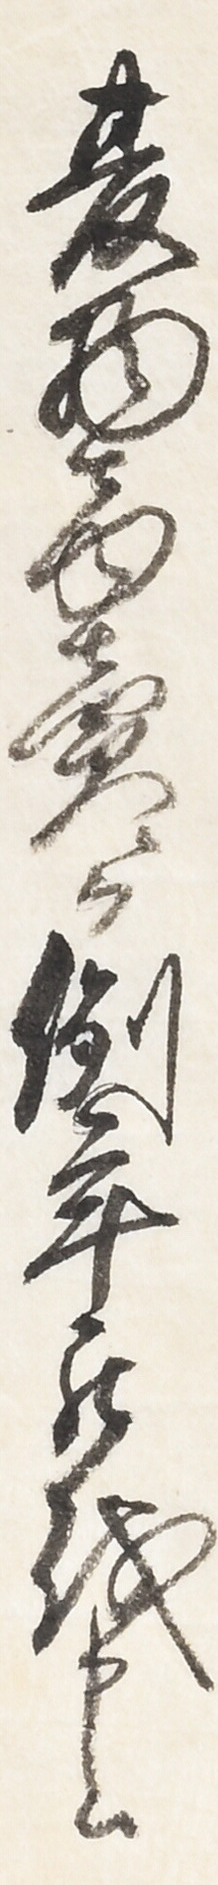夏物商売ニ而例年罷越申候
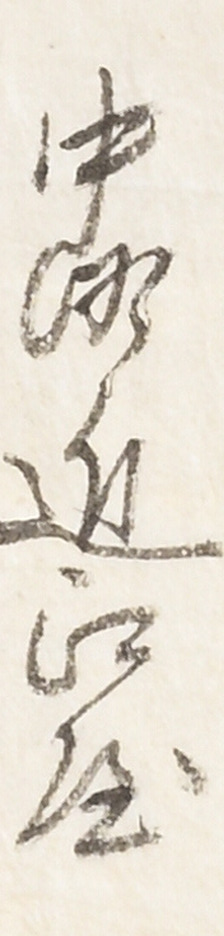中町近江屋
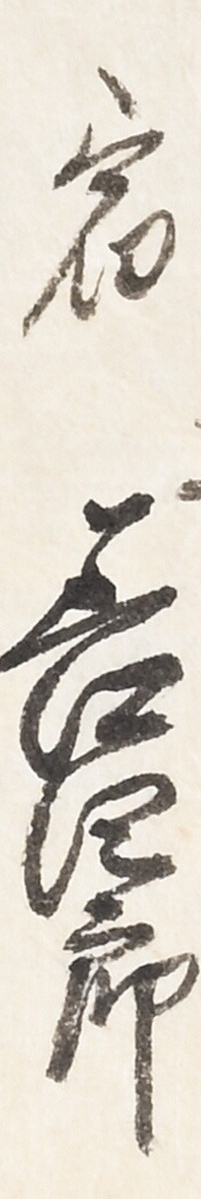宿善四郎
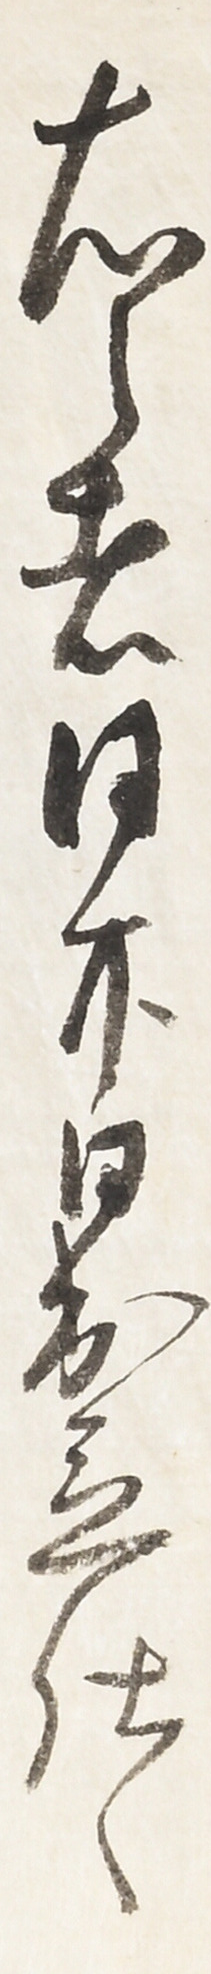右之者同廿日出立仕候
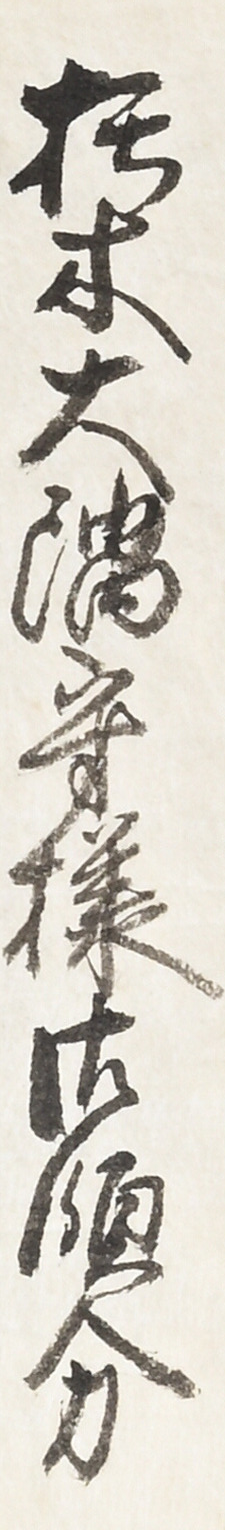朽木大隅守様御領分
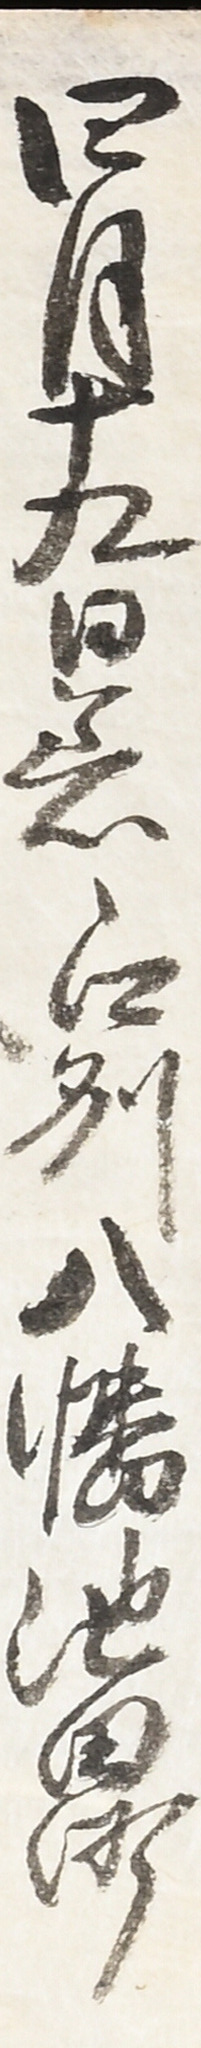四月十九日着江州八幡池田町
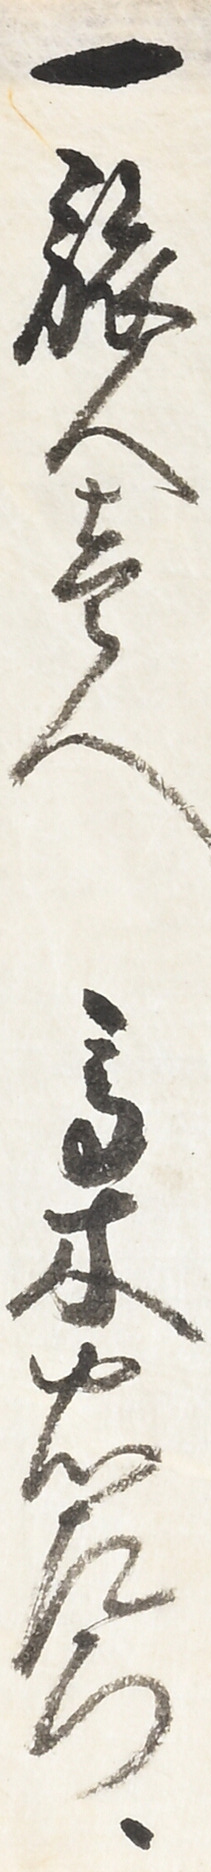一旅人壱人高木忠左衛門・
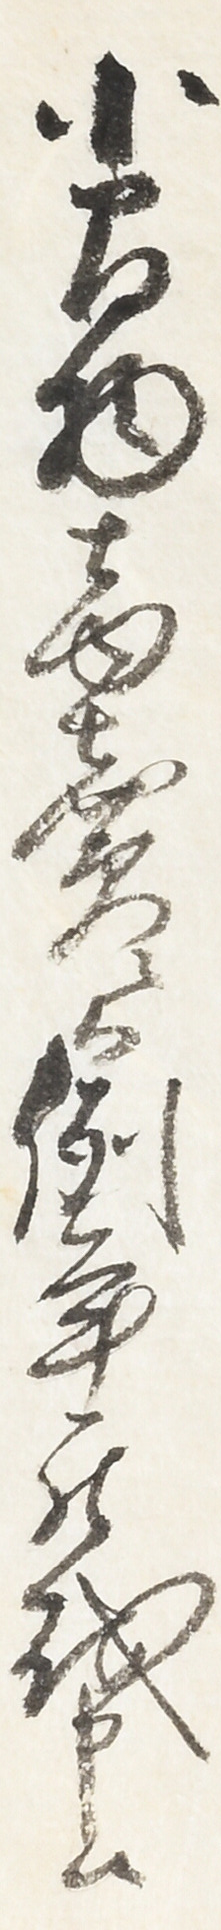小間物商売ニ而例年罷越申候
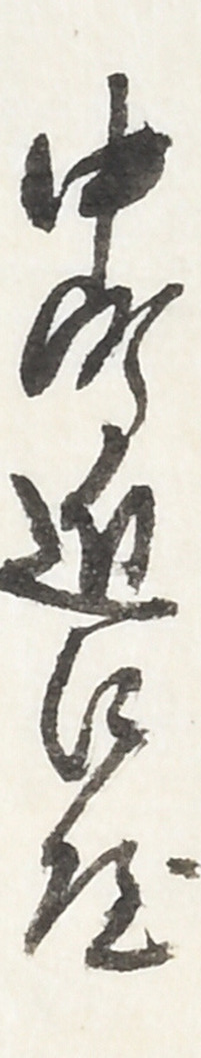中町近江屋
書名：旅人泊控帳
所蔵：伊那市立高遠町図書館・合同会社AMANE
